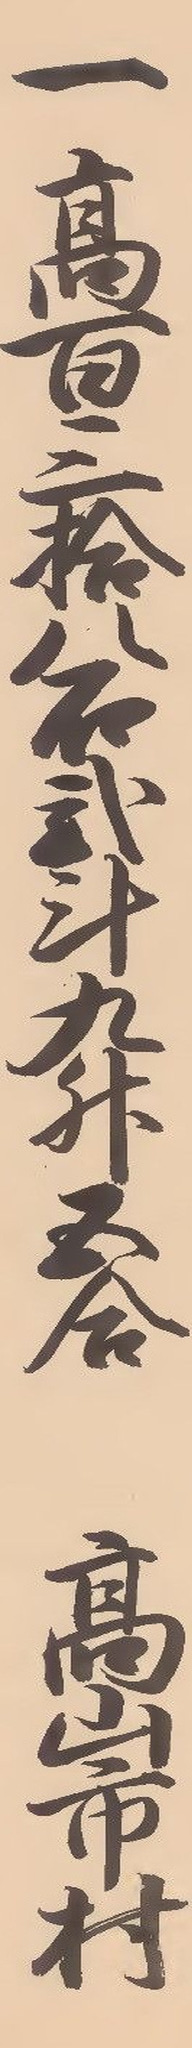一高百三拾八石弐斗九升五合高山市村
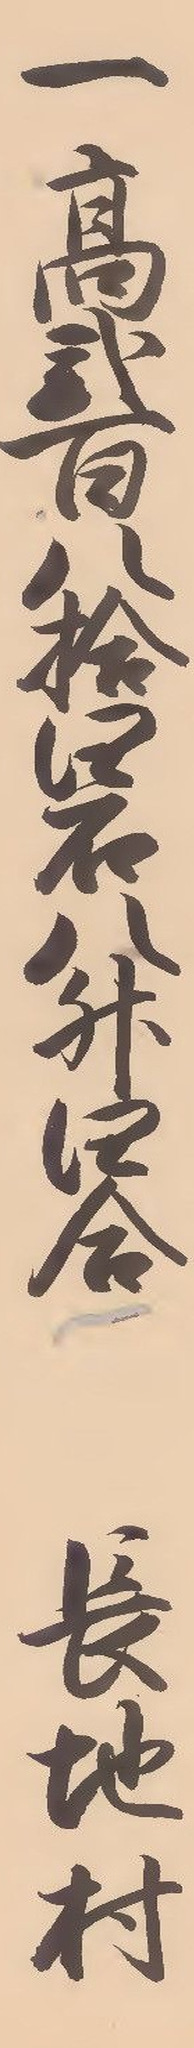一高弐百八拾四石八升四合長地村

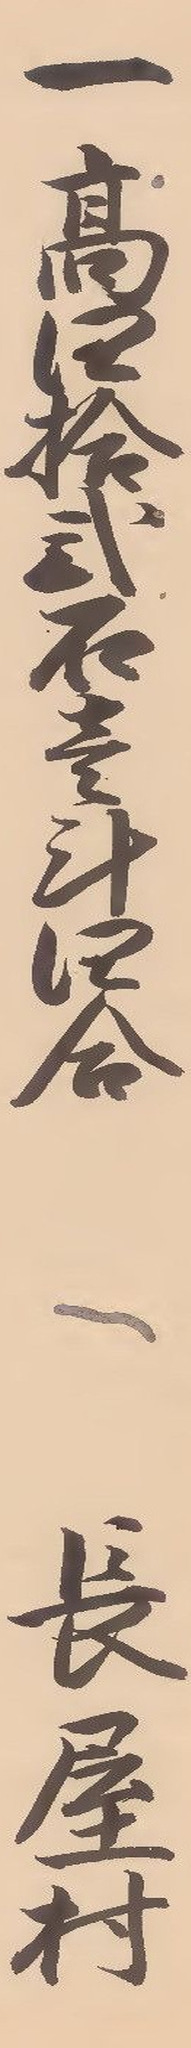一高四拾弐石壱斗四合長屋村
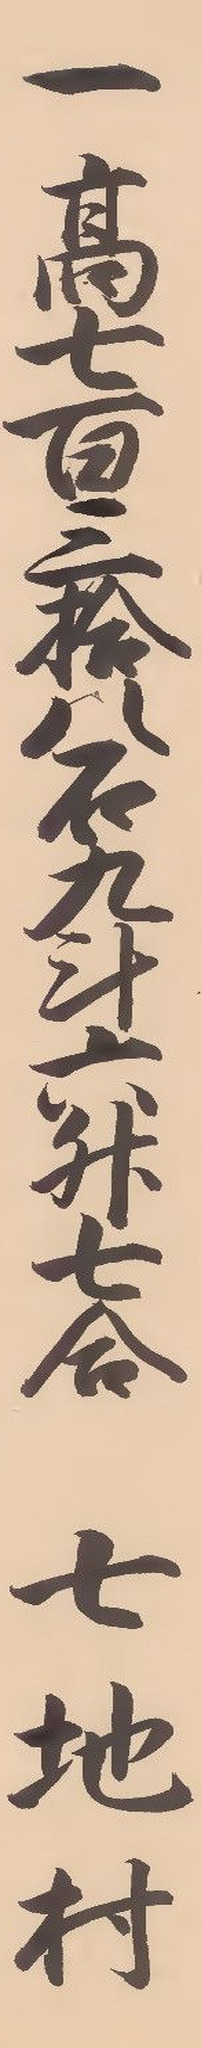一高七百三拾八石九斗六升七合七地村
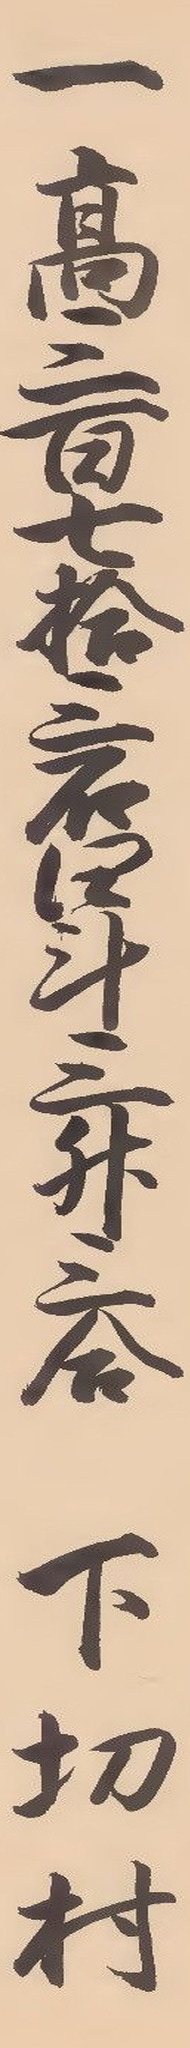一高三百七拾三石四斗三升三合下切村
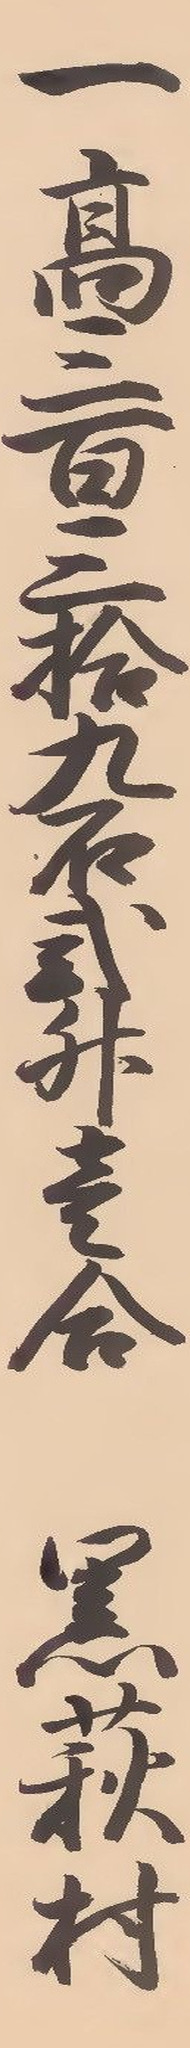一高三百三拾九石弐升壱合黒萩村
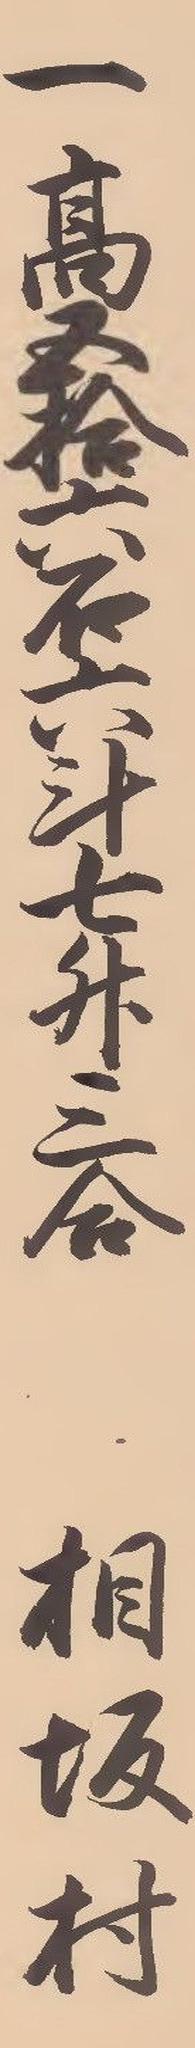一高五拾六石六斗七升三合相坂村
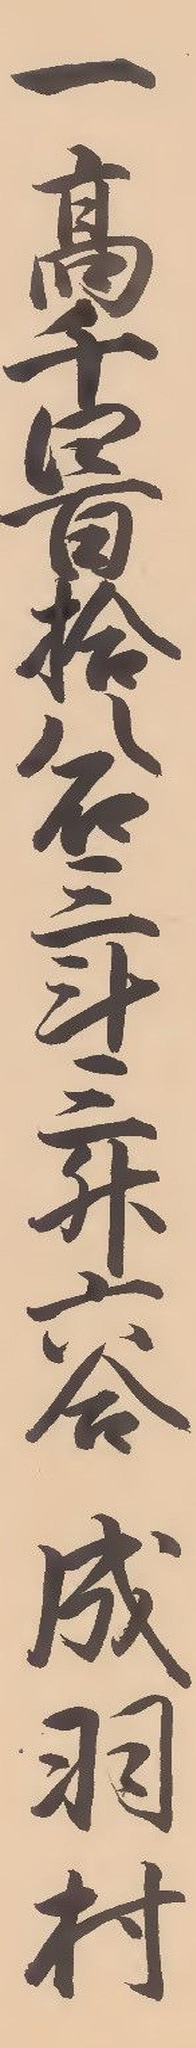一高千四百拾八石三斗三升六合成羽村
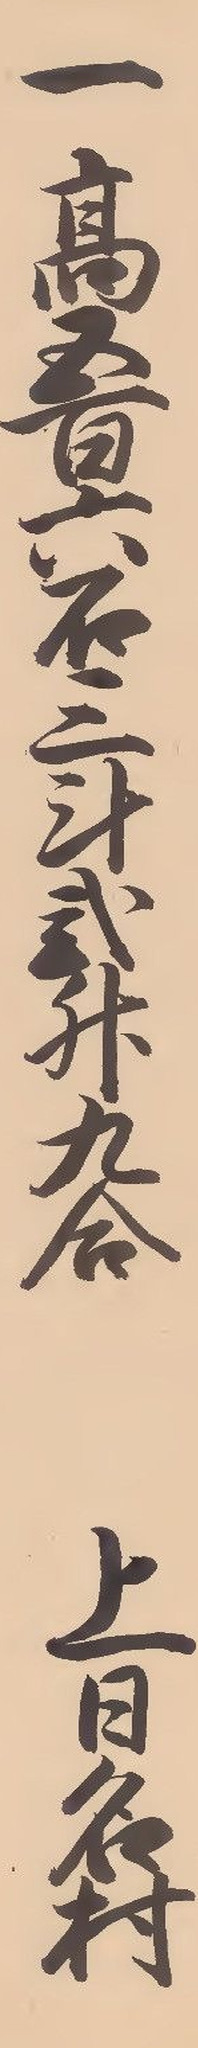一高五百六石三斗弐升九合上日名村
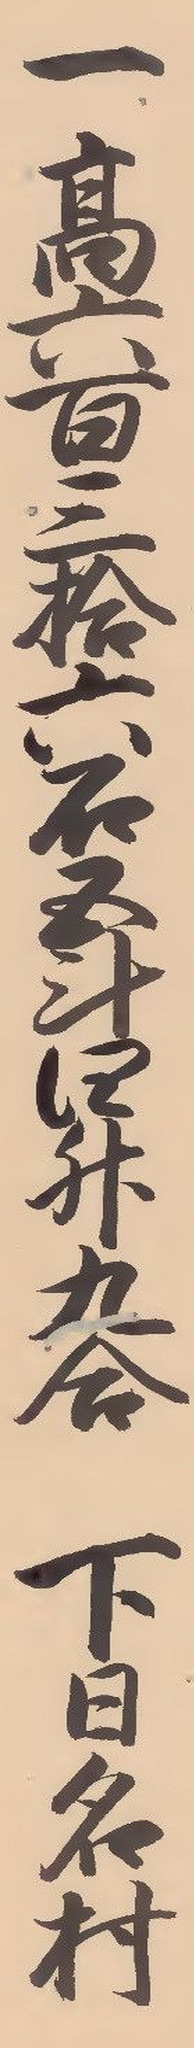一高六百三拾六石五斗四升九合下日名村

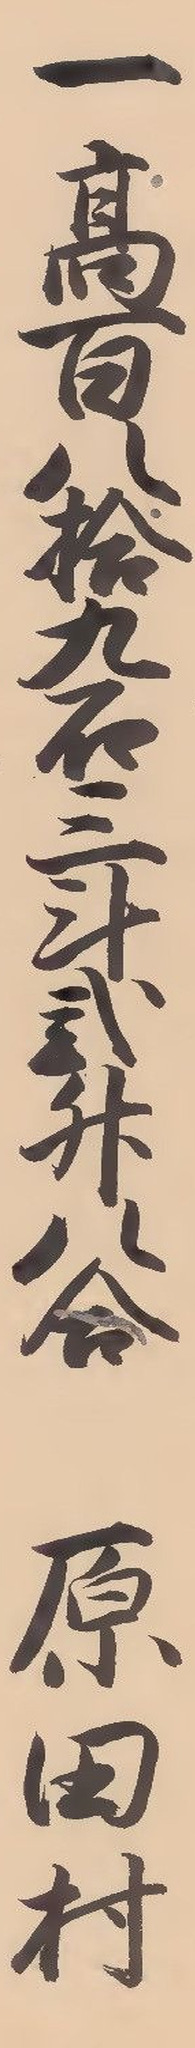一高百八拾九石三斗弐升八合原田村
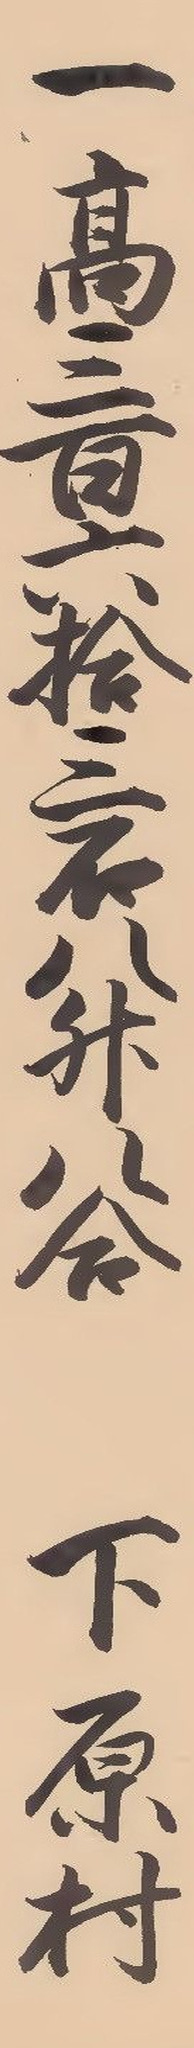一高三百六拾三石八升八合下原村
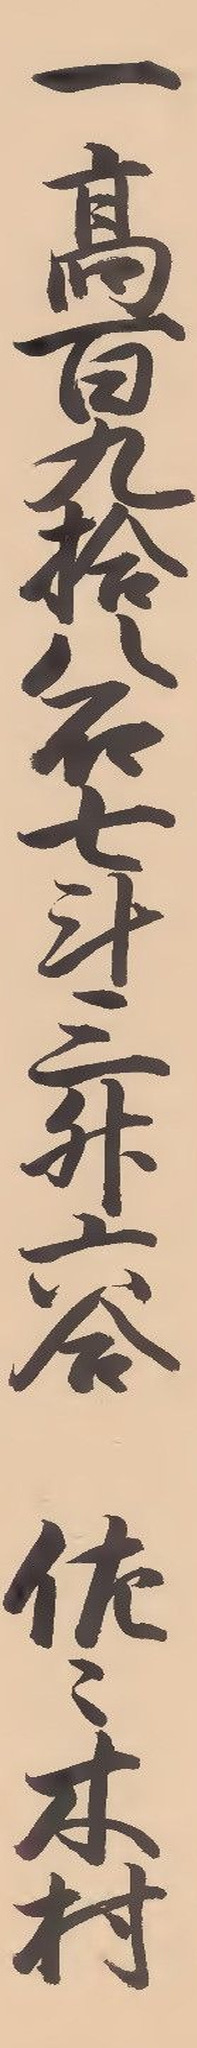一高百九拾八石七斗三升六合佐々木村
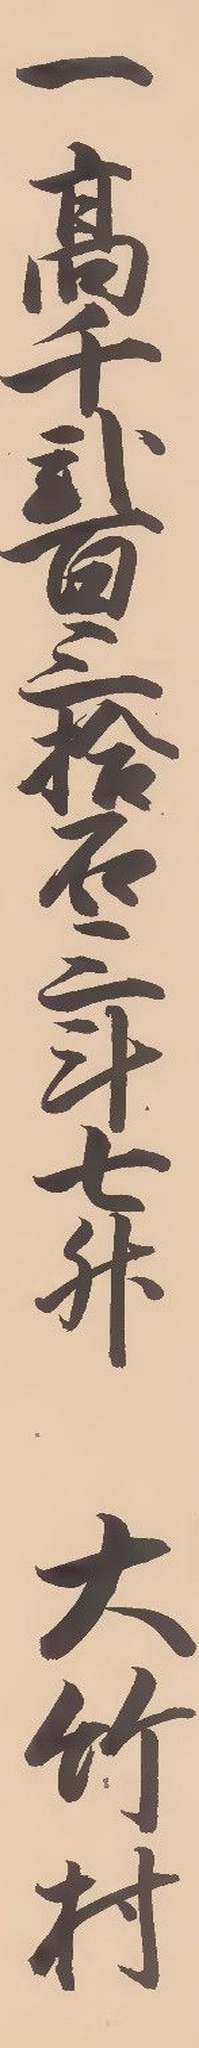一高千弐百三拾石三斗七升大竹村
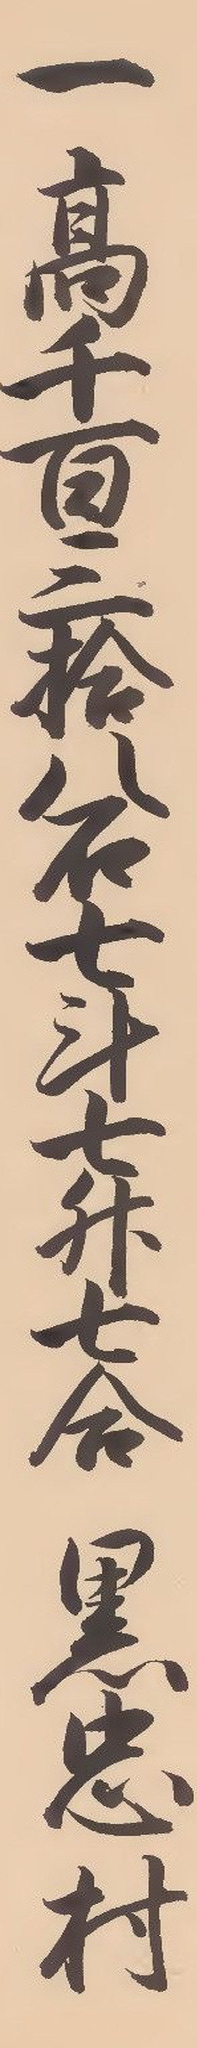一高千百三拾八石七斗七升七合黒忠村
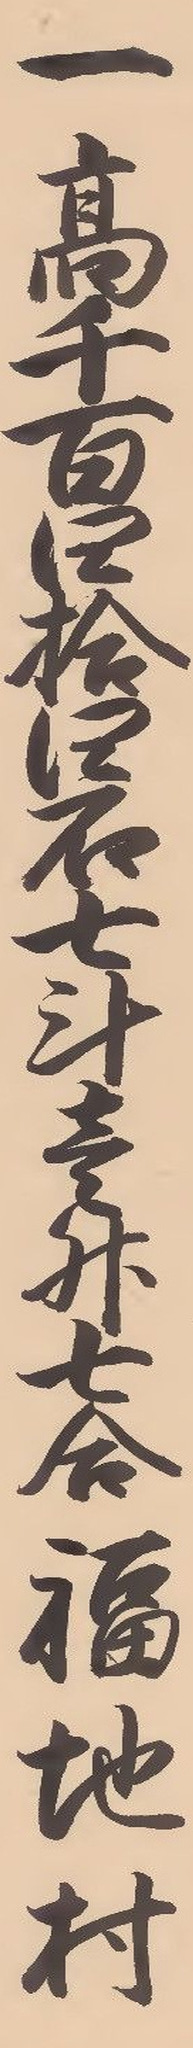一高千百四拾四石七斗壱升七合福地村
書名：備中国郷帳
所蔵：国立公文書館 National Archives of Japan
